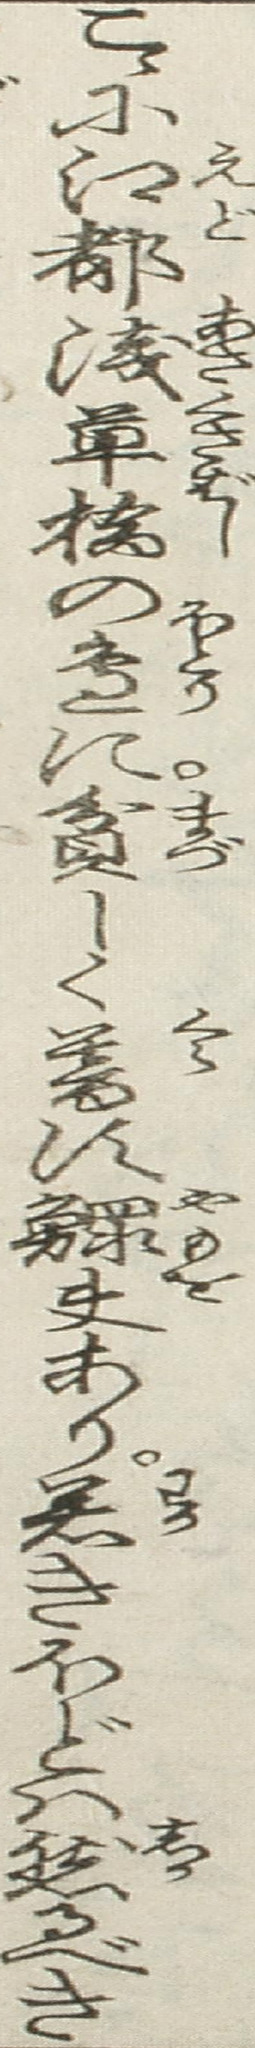こゝに江都浅草橋の辺に。貧しく暮す鰥夫あり。若きほどは然るべき
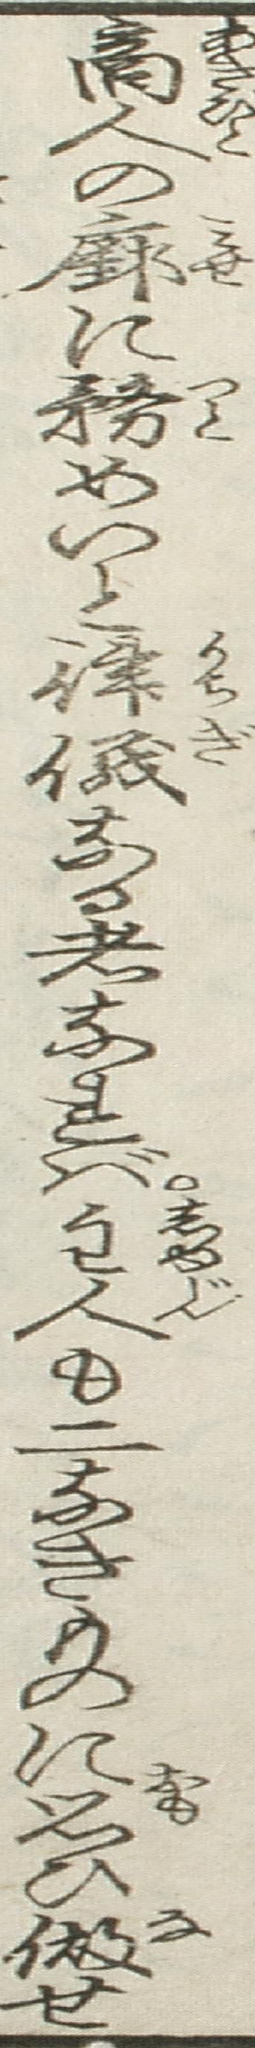商人の店に務めいと律義なる者なれば。主人も二なきものに思ひ倣せ
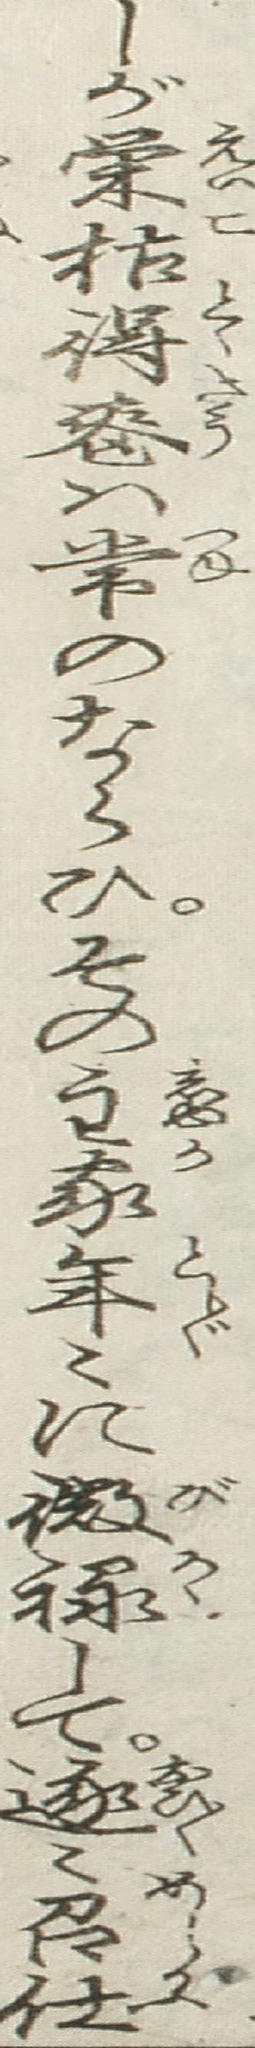しが栄枯得喪は常のならひ。その主家年〻に微禄して。逐〻召仕
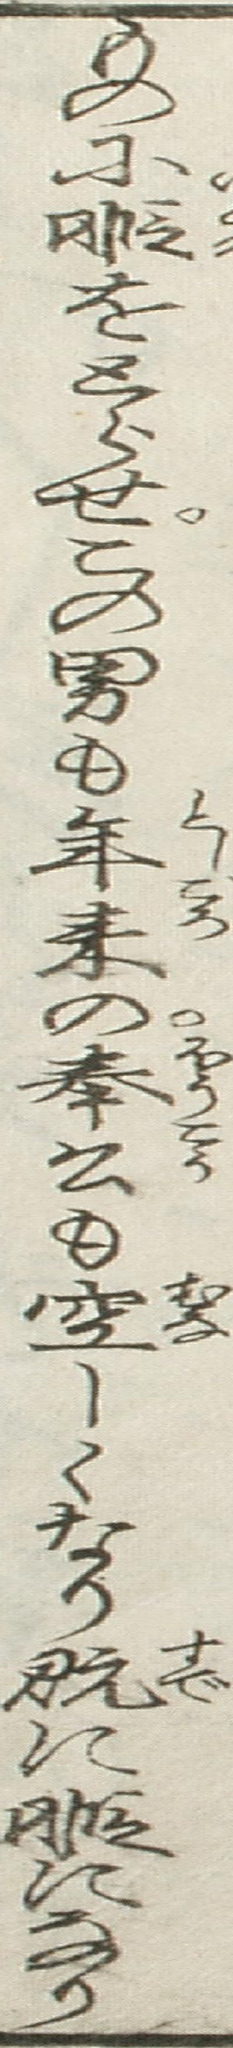ものに暇をとらせ。この男も年来の。奉公も空しくなり既に暇になり
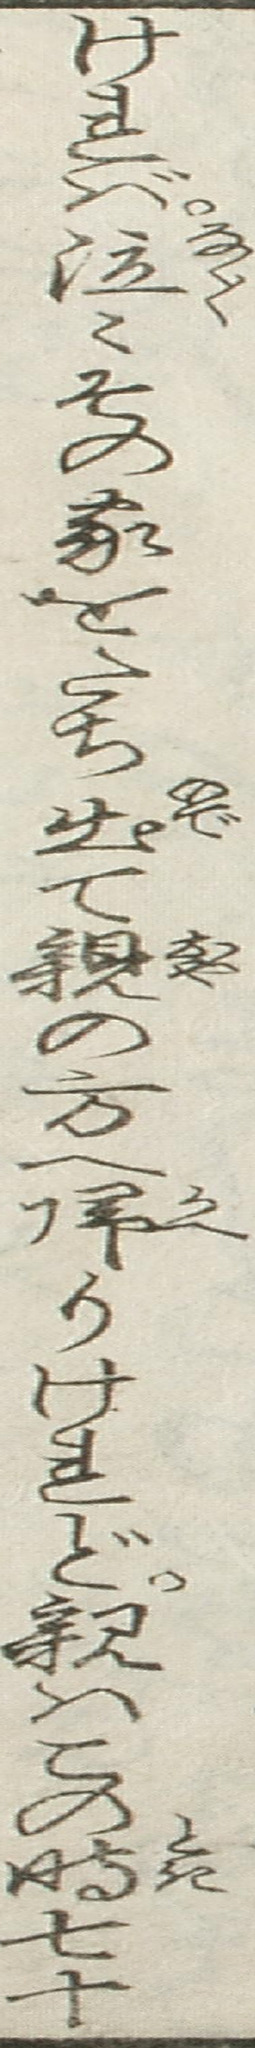ければ。泣〻その家をたち出て親の方へ帰りけれど。親はこの時七十
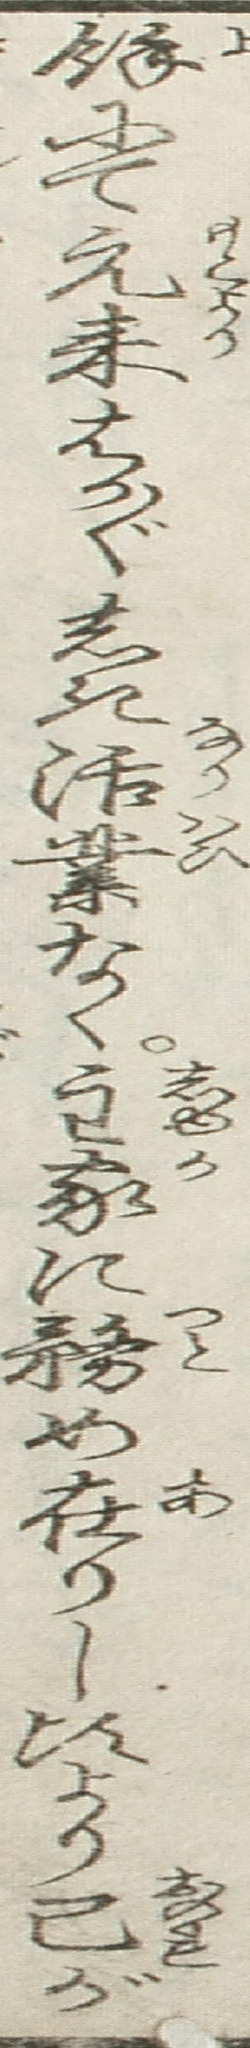餘にて元来はか〴〵しき活業なく。主家に務め在りし頃より己が
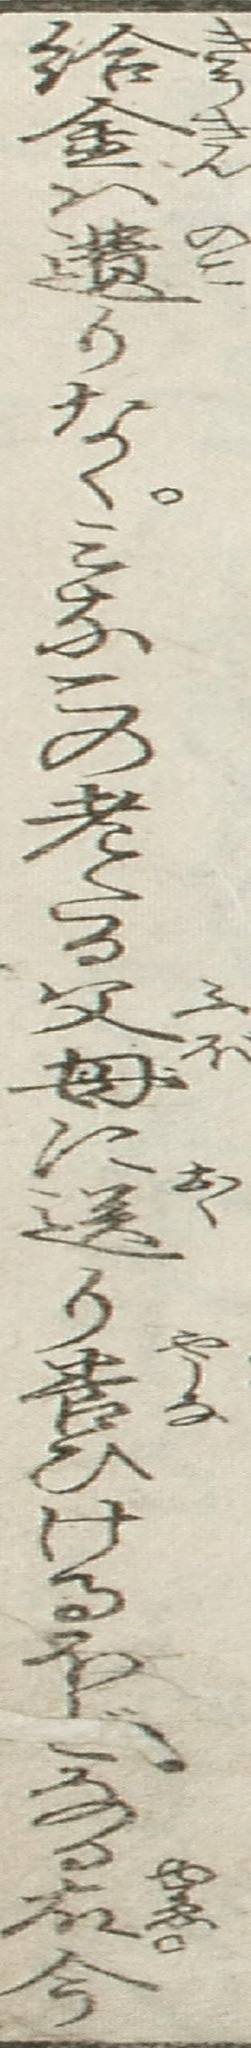給金は遺りなく。みなこの老たる父母に送り養ひけるほどなる故。今

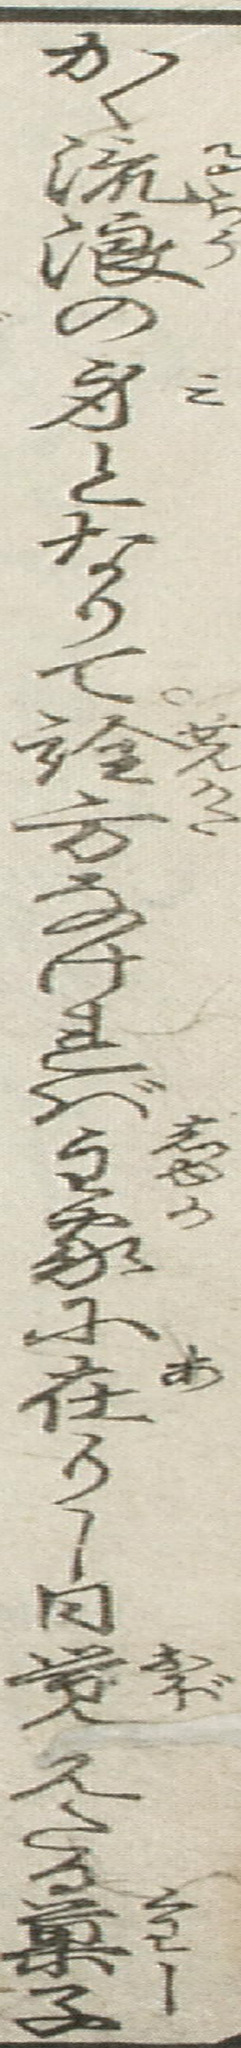かく流浪の身となりて。詮方なければ主家に在りし日覚えたる菓子
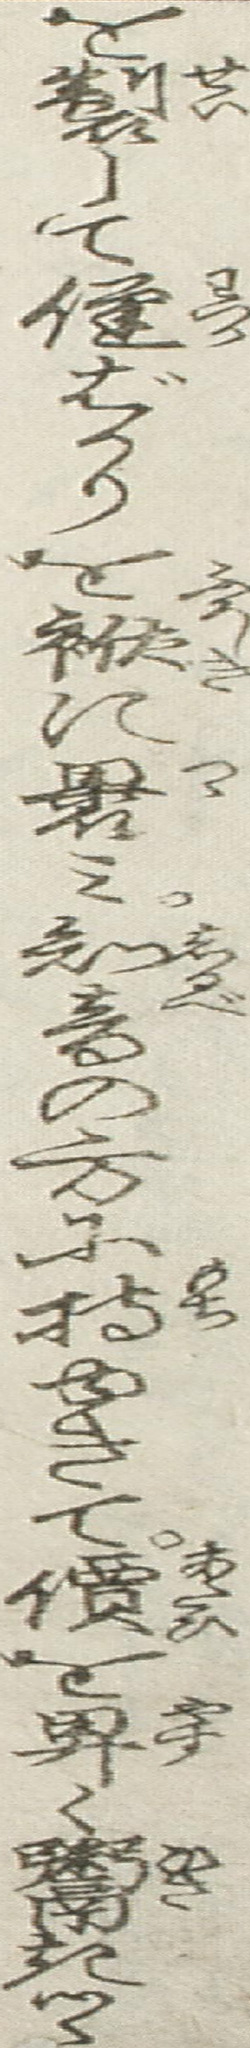を製して僅ばかりを袱に裹み。知音の方に持ゆきて。価を卑く鬻きつゝ
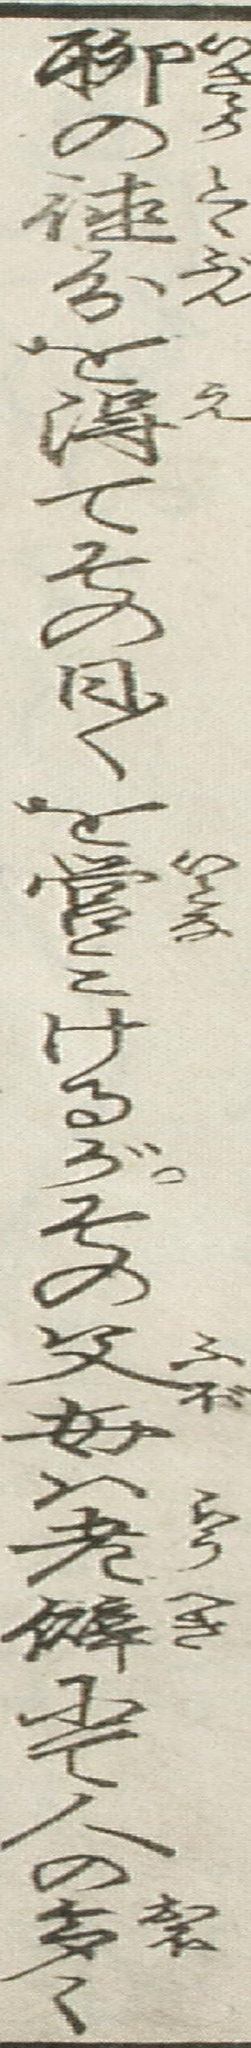聊の徳分を得てその日〳〵を営みけるが。その父母は老僻にて人の多く
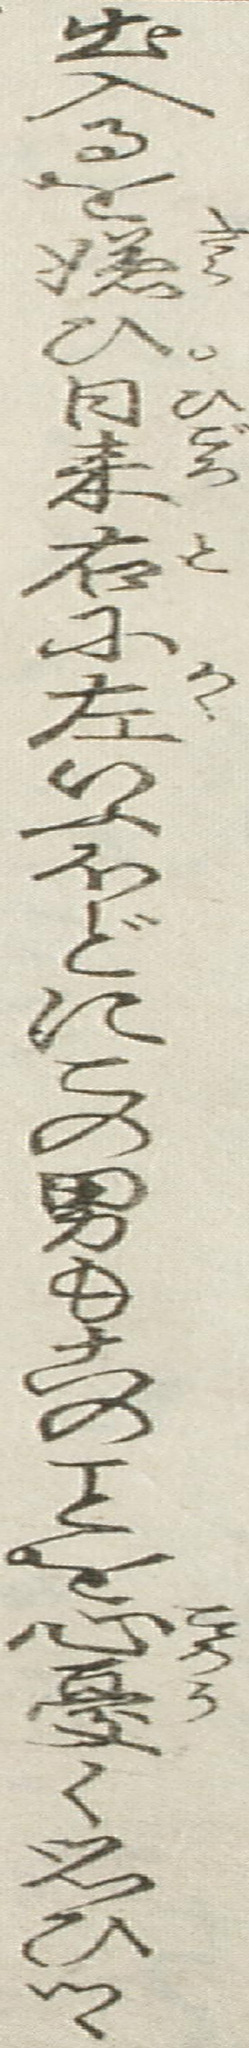出入るを嫌ひ。日来右に左いふほどにこの男もこのことを心憂く思ひつゝ
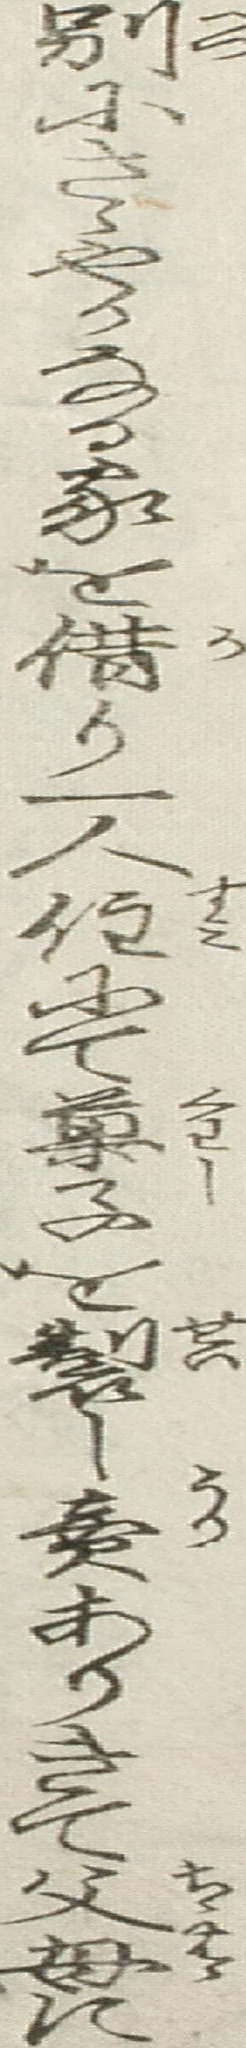別にさゝやかなる家を借り一人住にて菓子を製し売ありきて父母に
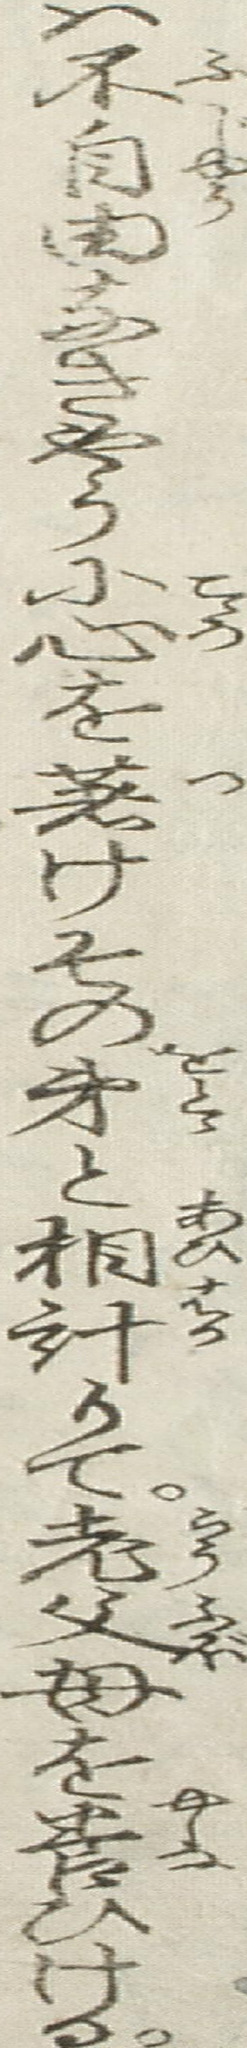は不自由なきやうに心を著けその弟と相計りて。老父母を養ひける。
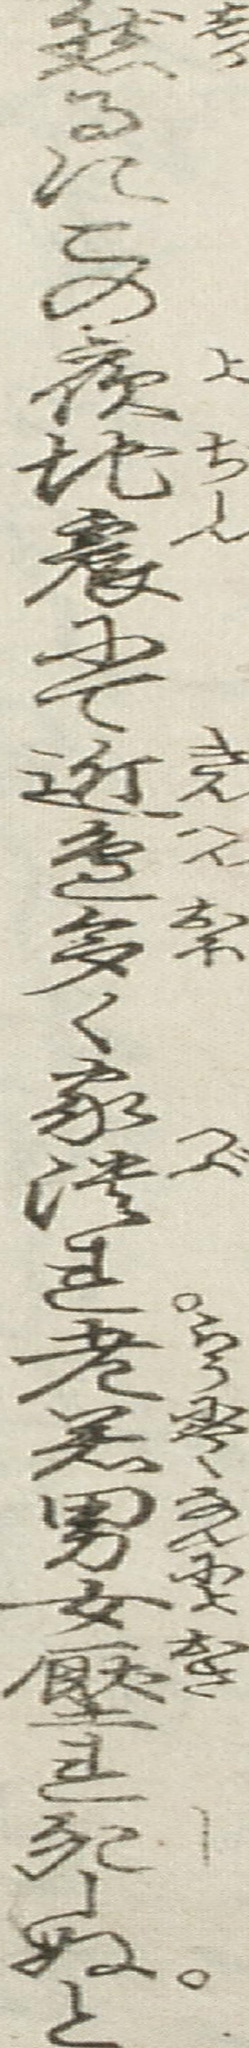然るにこの夜地震にて近辺多く家潰れ。老若男女圧れ死しぬ。と
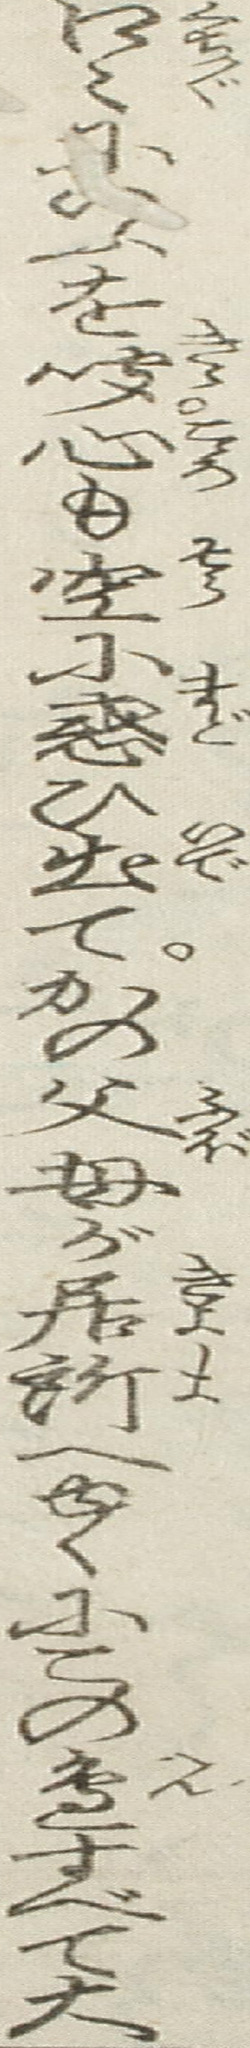口〻にいふを聞。心も空に惑ひ出て。かの父母が居所へゆくにこの辺すべて大
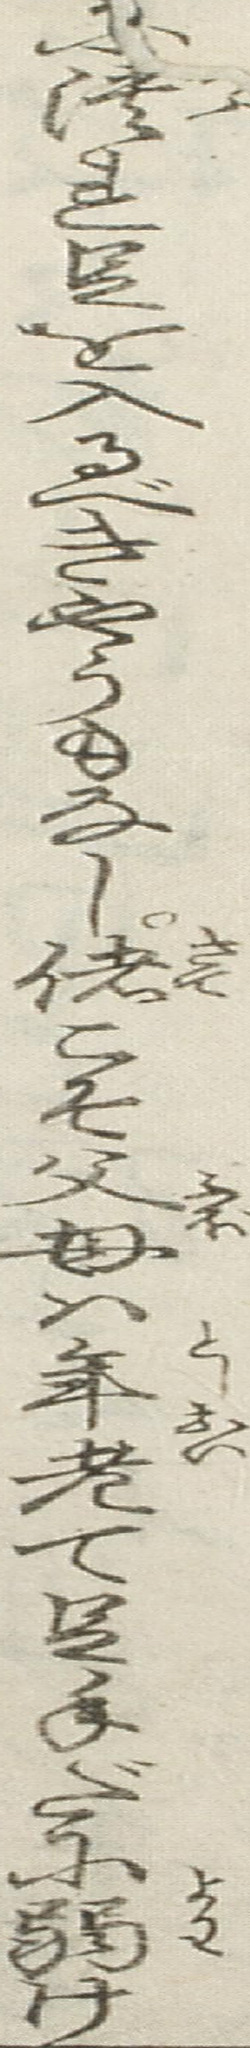に潰れ足を入るべきやうもなし。偖こそ父母は年老て足手だに弱け
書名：安政見聞録　下
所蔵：東京大学地震研究所図書室 Earthquake Research Institute Library, The University of Tokyo, JAPAN
